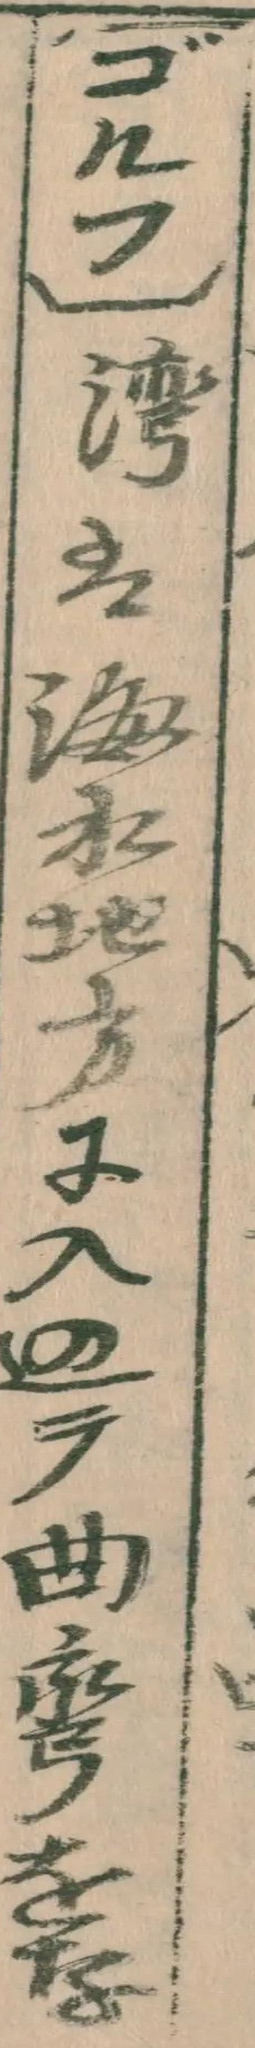(ゴルフ)湾は海水地方に入込テ曲弯をな
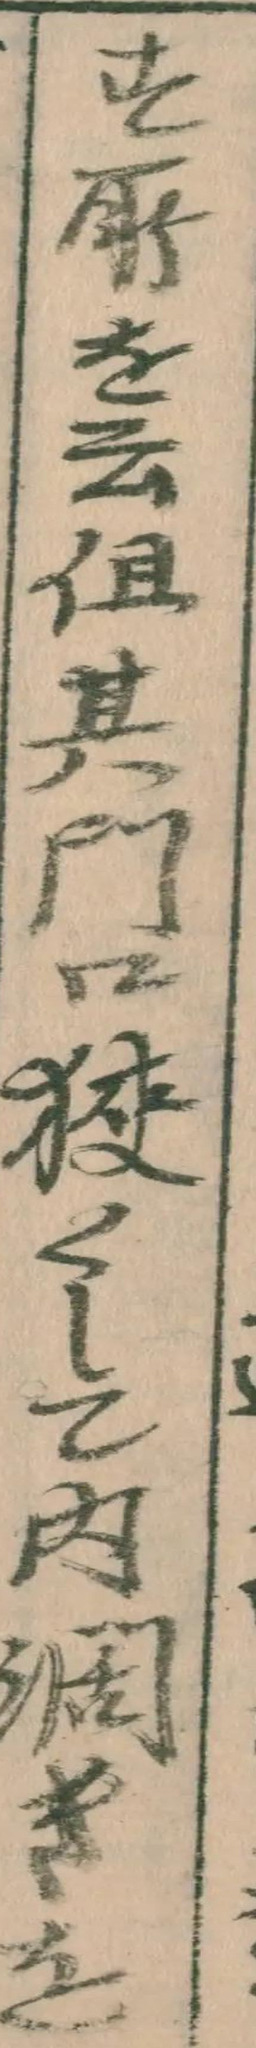す所を云但其門口狭くして内濶きを
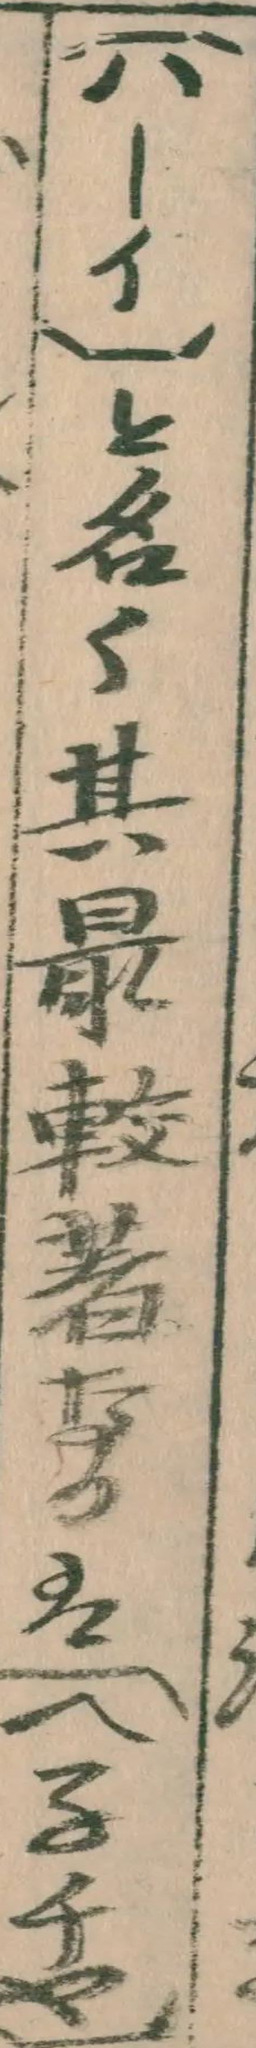(ハーイ)と名く其最較著なるは(ヘネチヤ)
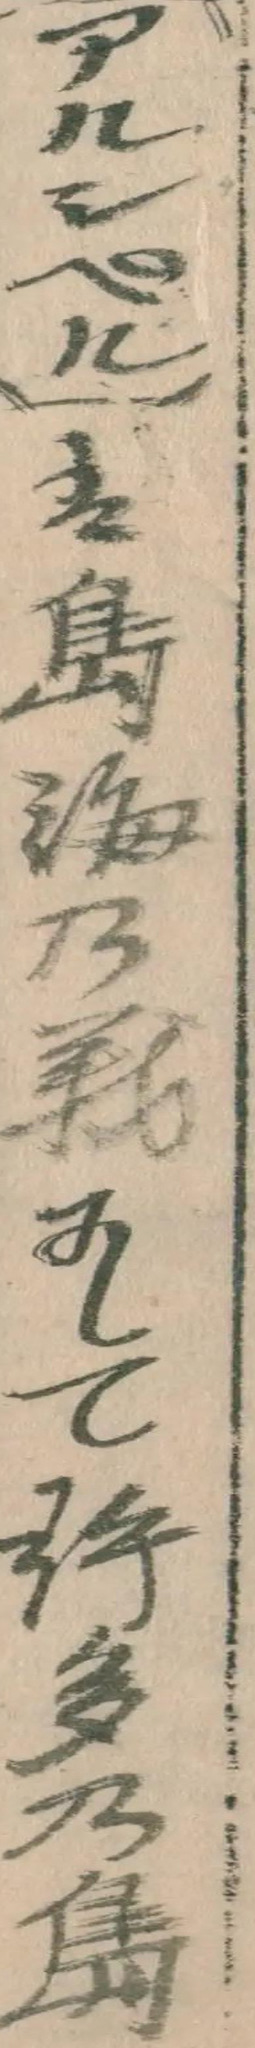(アルシペル)は島海の義にして許多の島
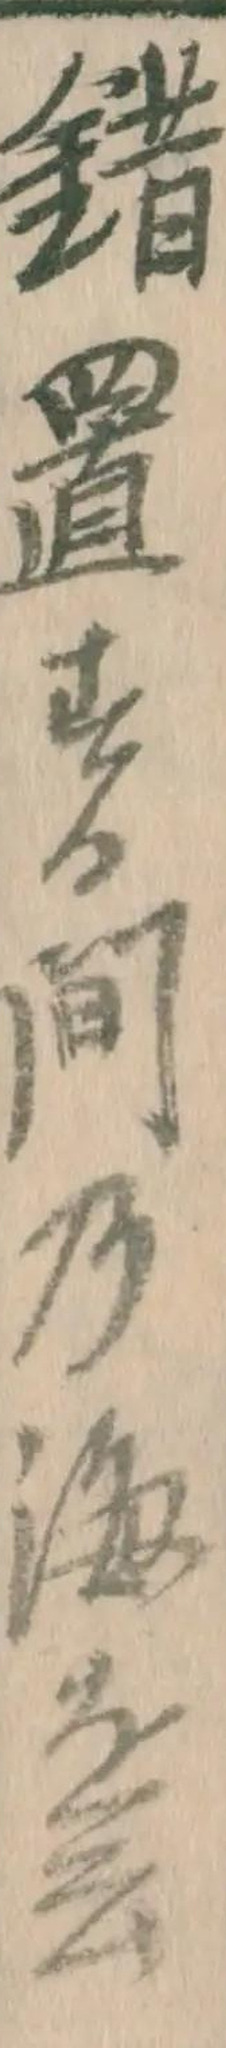錯置する間の海を云

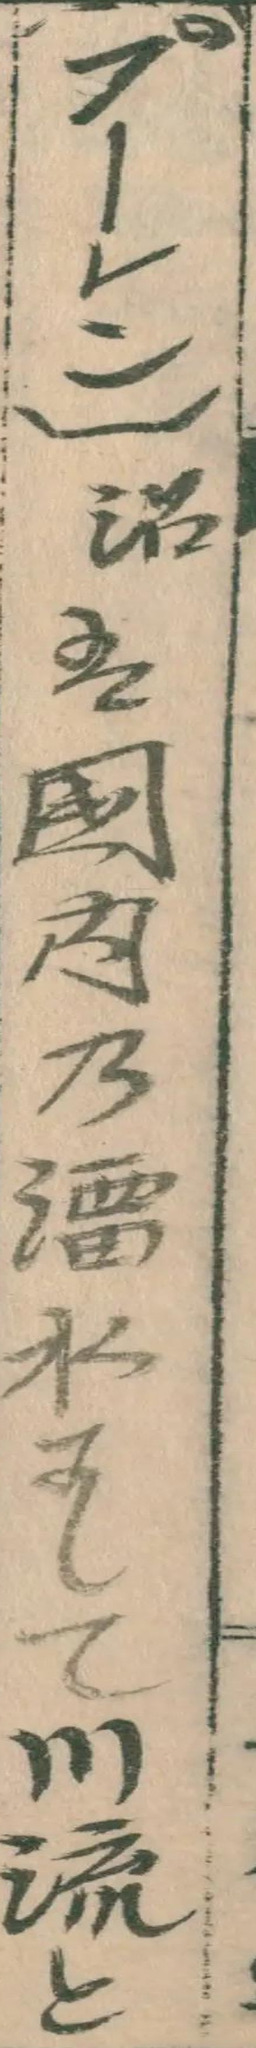(プーレン)沼は国内の溜水にして川流と
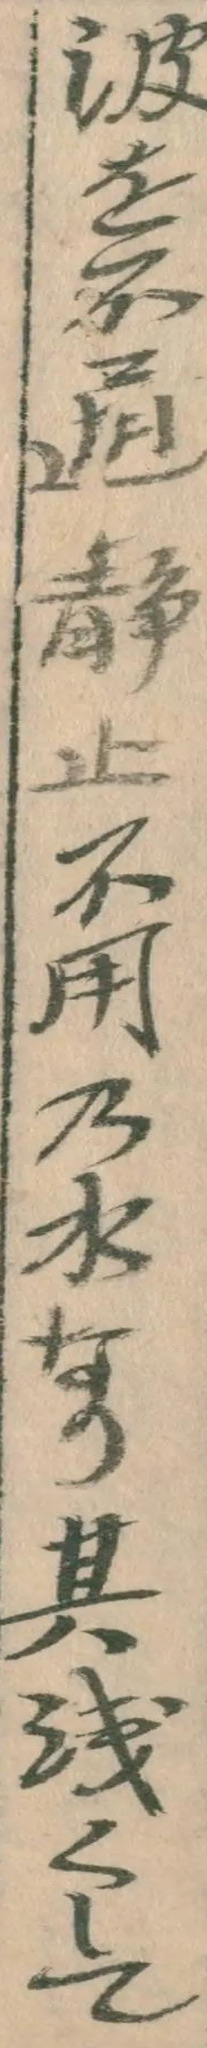波を不通静止不用の水なり其浅くして
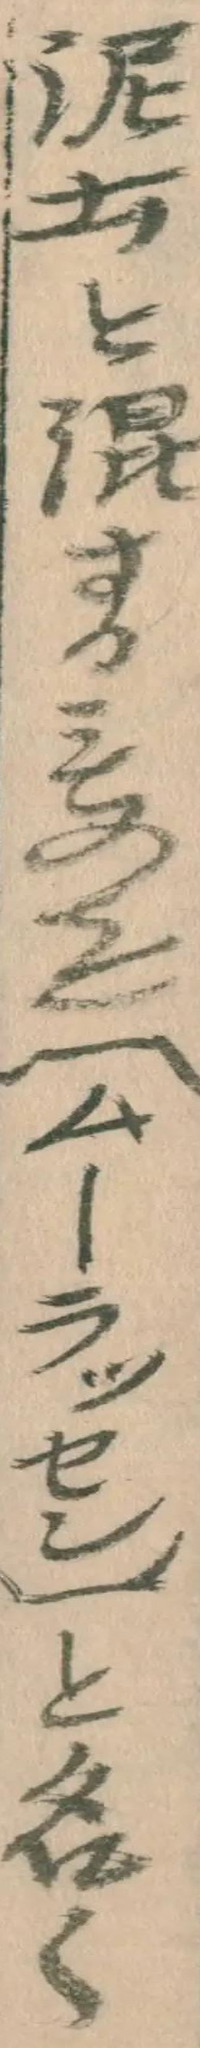泥土と混するものを(ムーラッセン)と名く
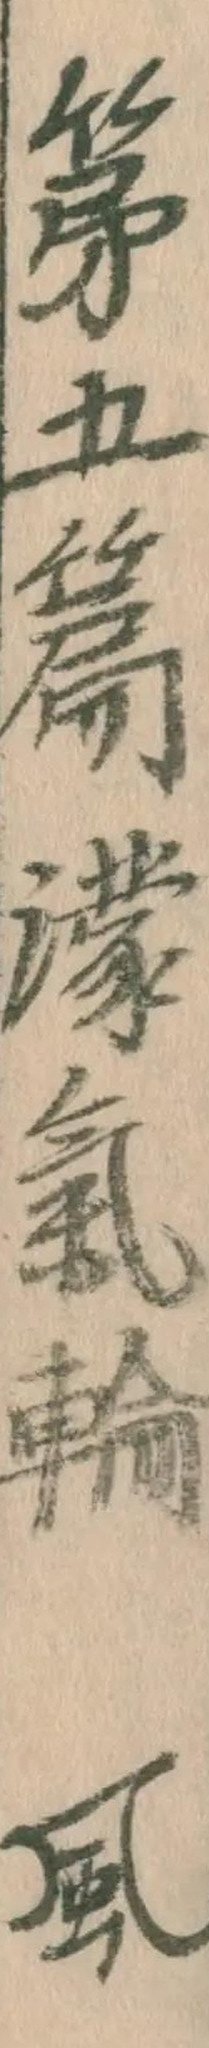第五篇濛気輪風
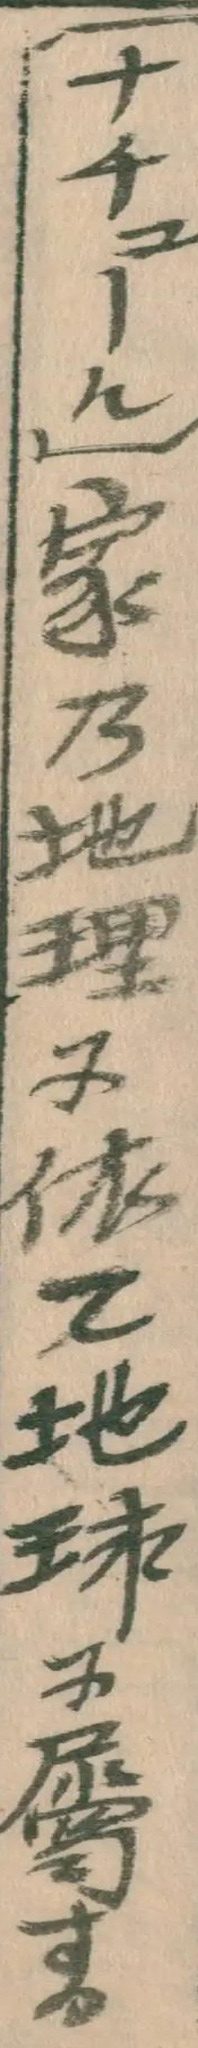(ナチュール)家の地理に依て地球に属する
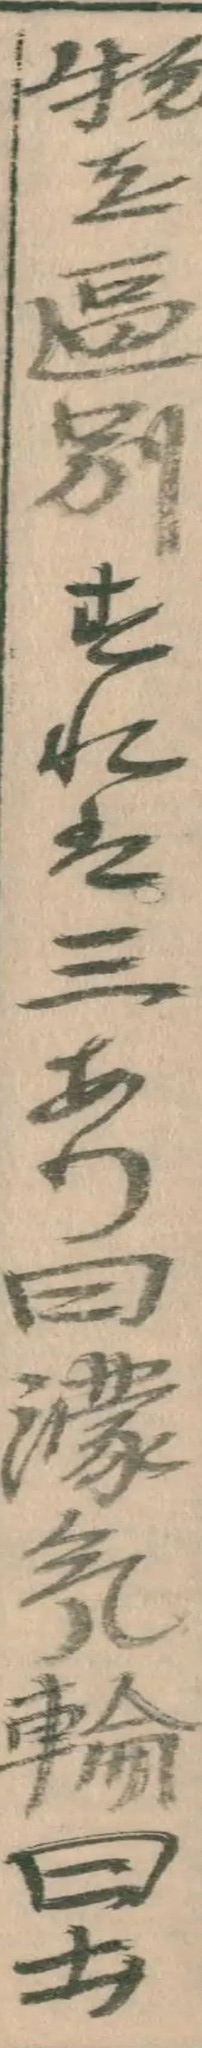物を区別すれは三あり曰濛気輪曰土
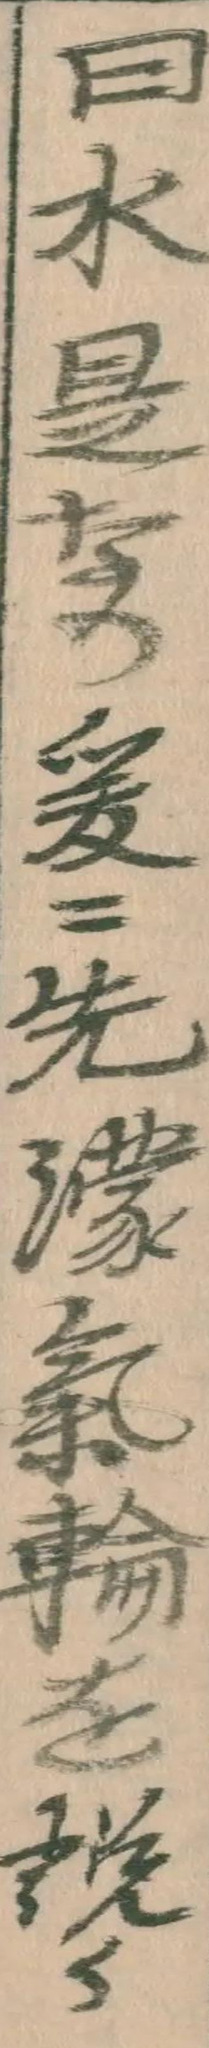曰水是なり爰に先濛気輪を説く
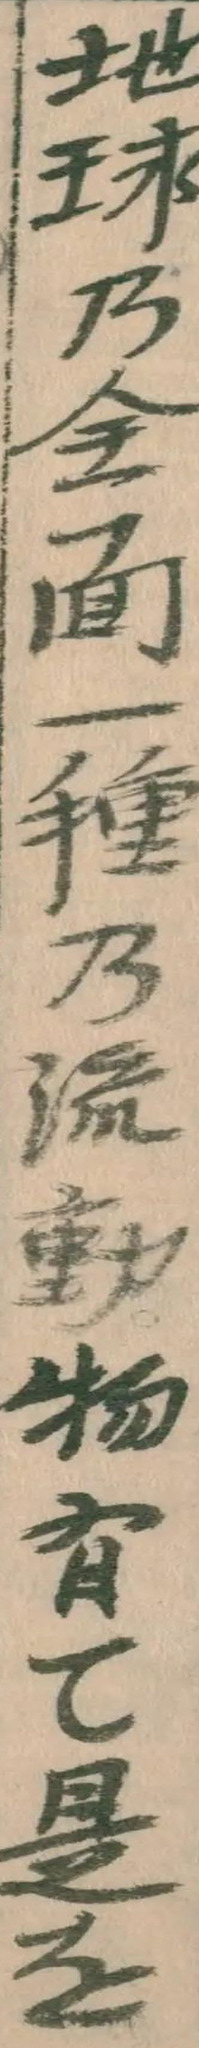地球の全面一種の流動物有て是を
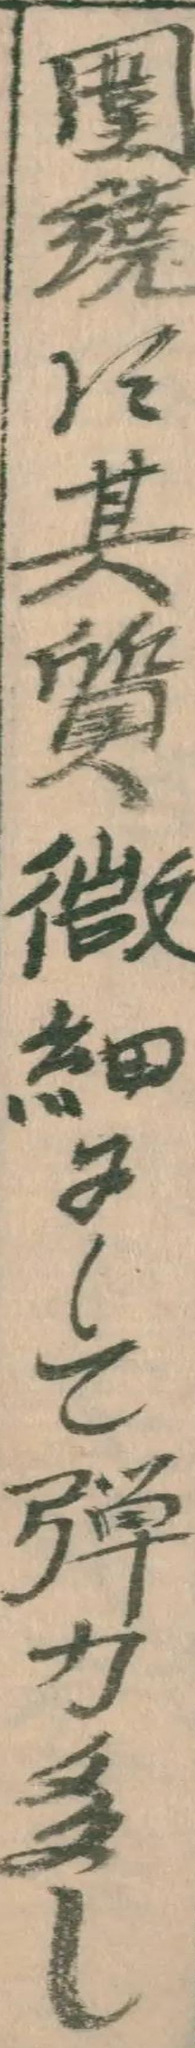囲繞す其質微細にして弾力多し
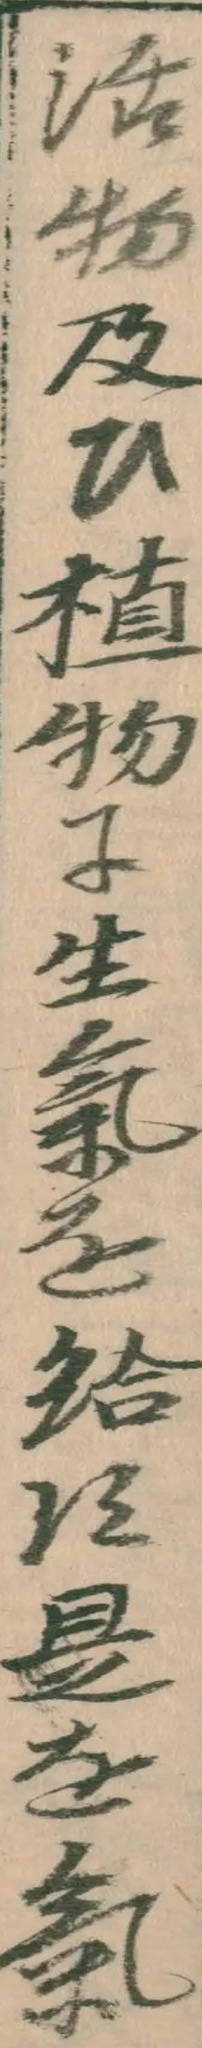活動及ひ植物に生気を給す是を気
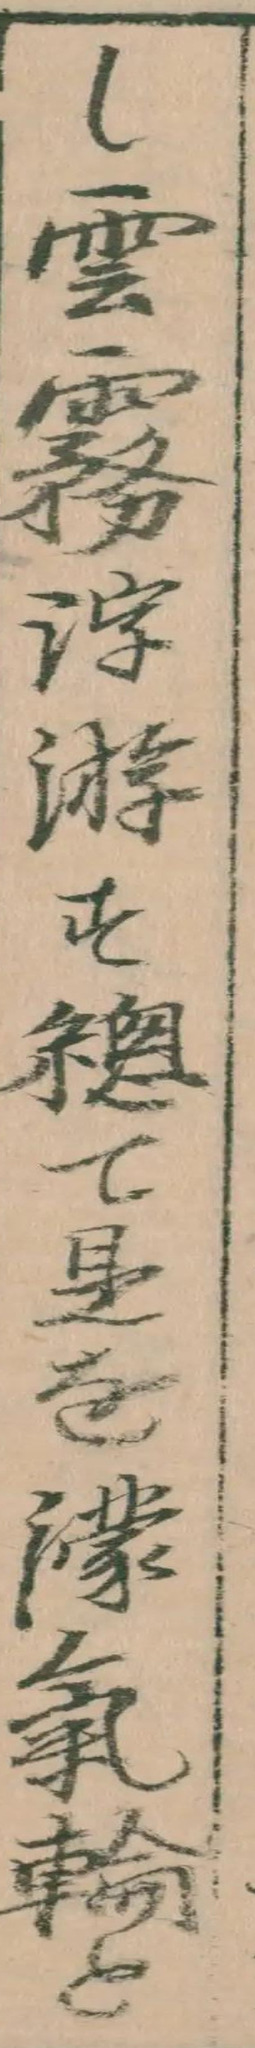し雲霧浮游す総て是を濛気輪と
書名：新釈輿地図説
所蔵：国立国会図書館 National Diet Library, JAPAN
